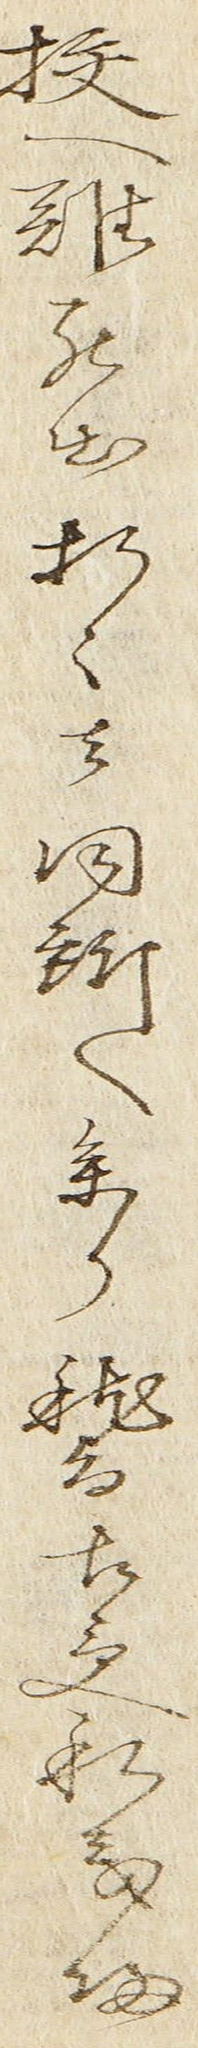校へ難罷出折々は同所へ参り稽古受私義帰
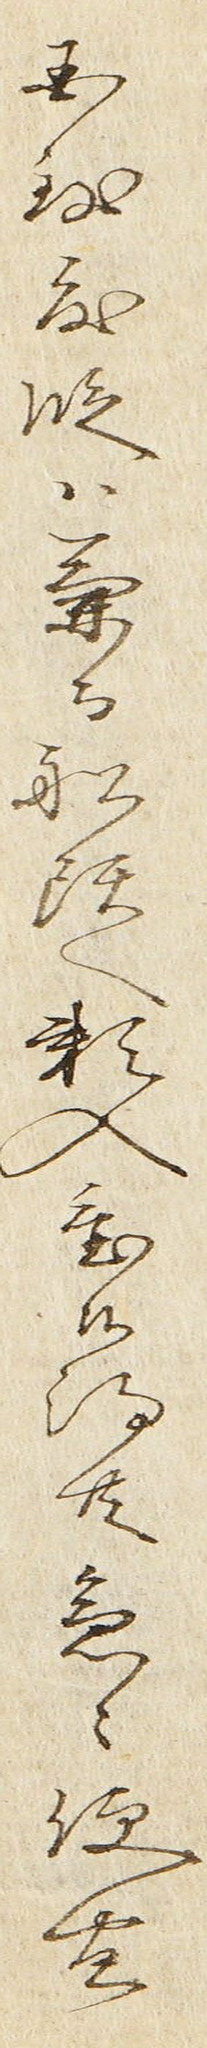国致度段は兼而船頭へ頼入置候得共急に便宜
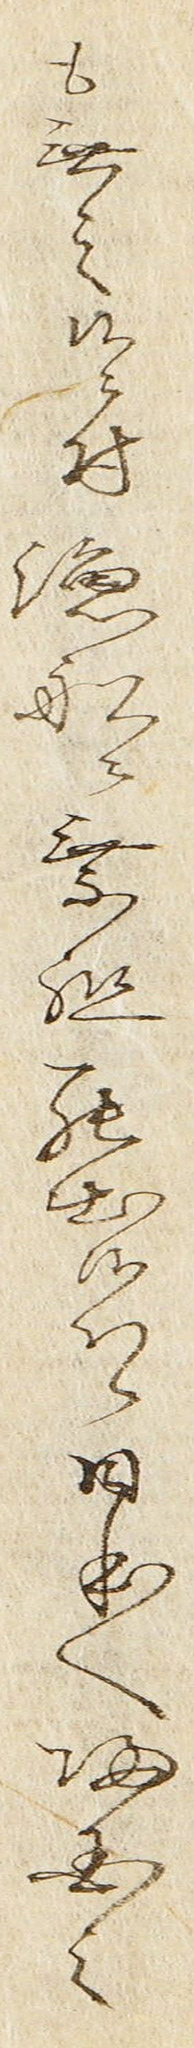も無之候に付漁船に乗組罷出候はゝ日本へ帰国之
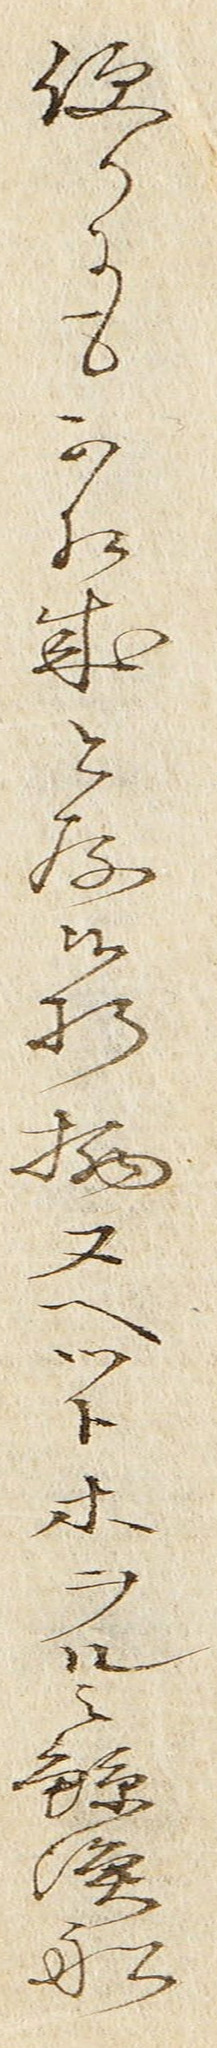便りにも可相成と存候折柄ヌヘツトホヲル之鯨漁船
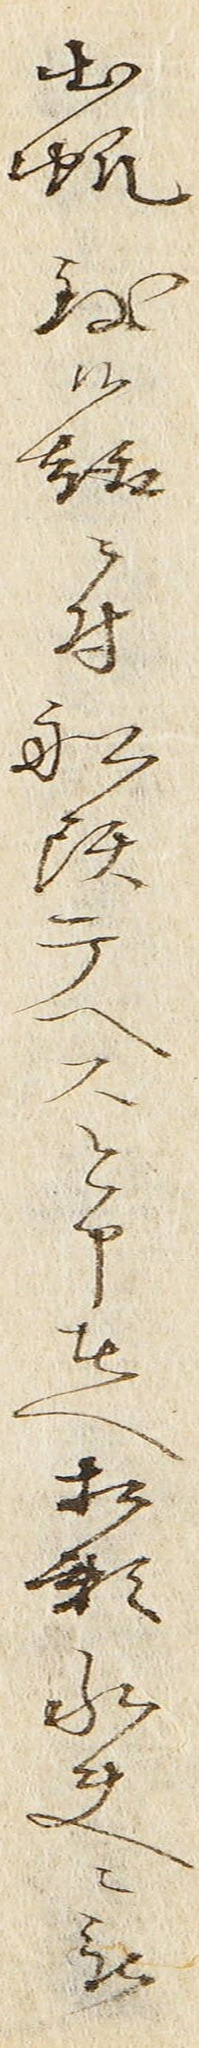出帆致候趣に付船頭テヘストと申者へ相頼水夫に被
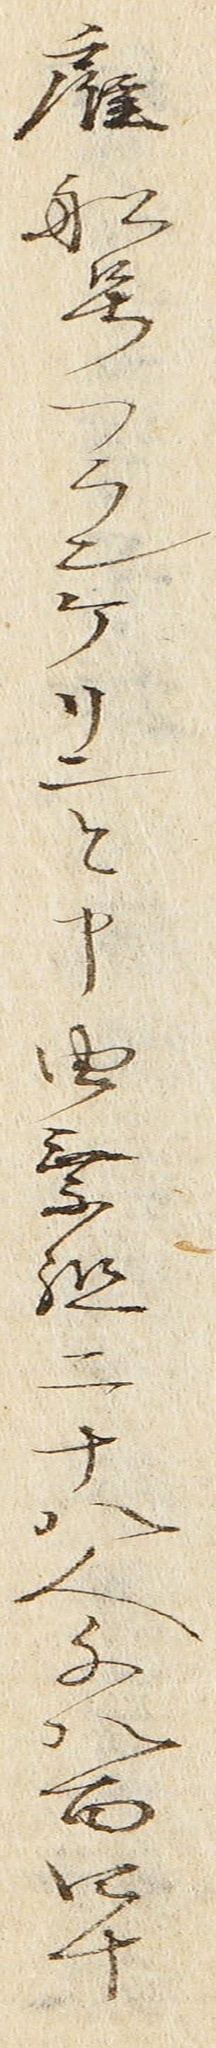雇船号フランケリンと申由乗組二十八人千八百四十
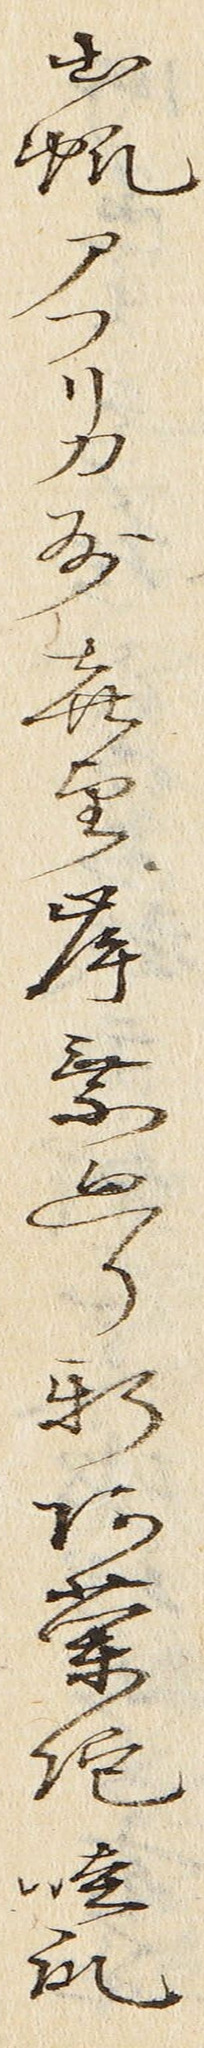出帆アフリカ州喜望岸乗廻り新阿蘭陀哇瓜
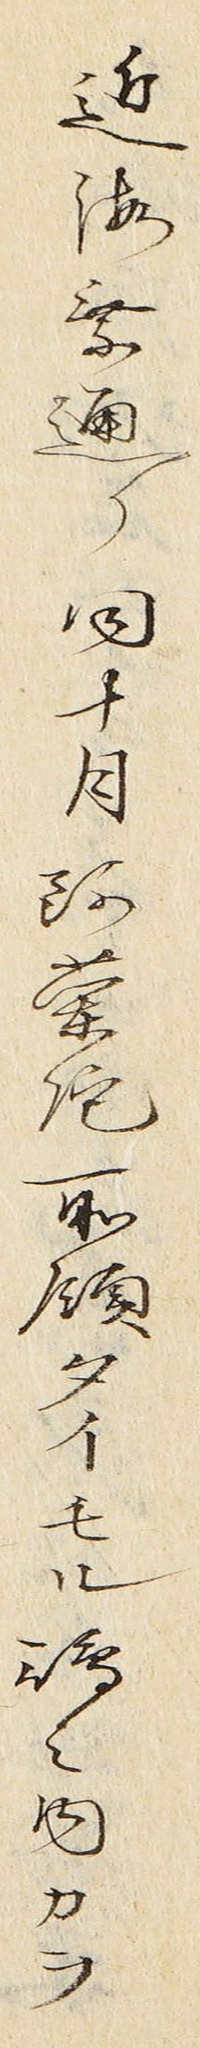近海乗通り同十月阿蘭陀所領タイモル嶋々内カラ
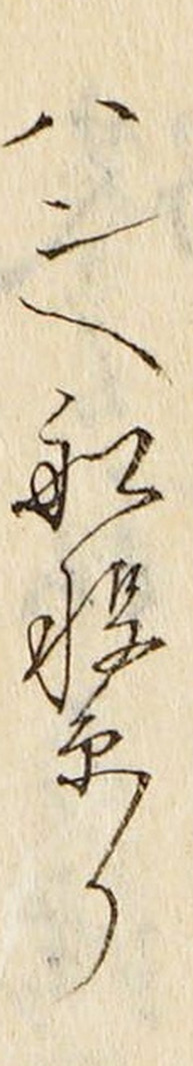ハンへ船繋り
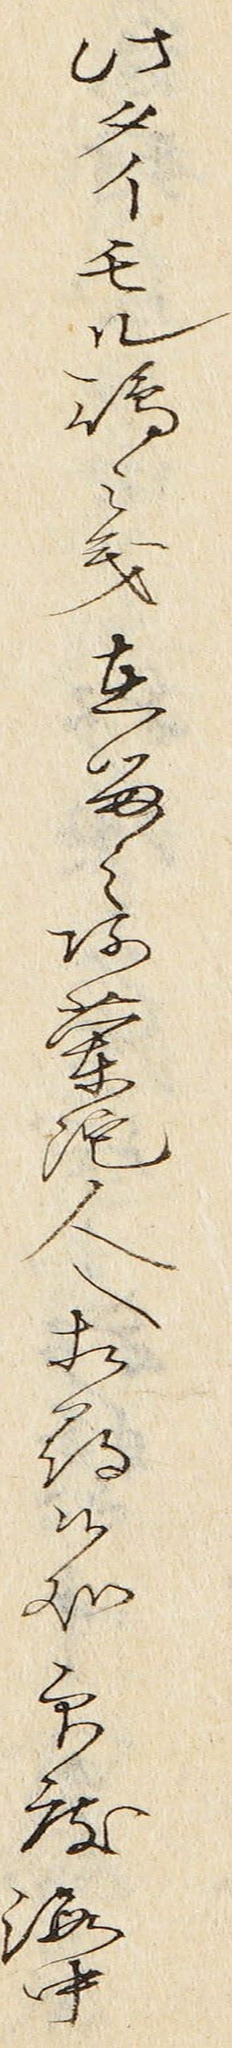此タイモル嶋之義在留之阿蘭陀人へ相尋候処印度海中
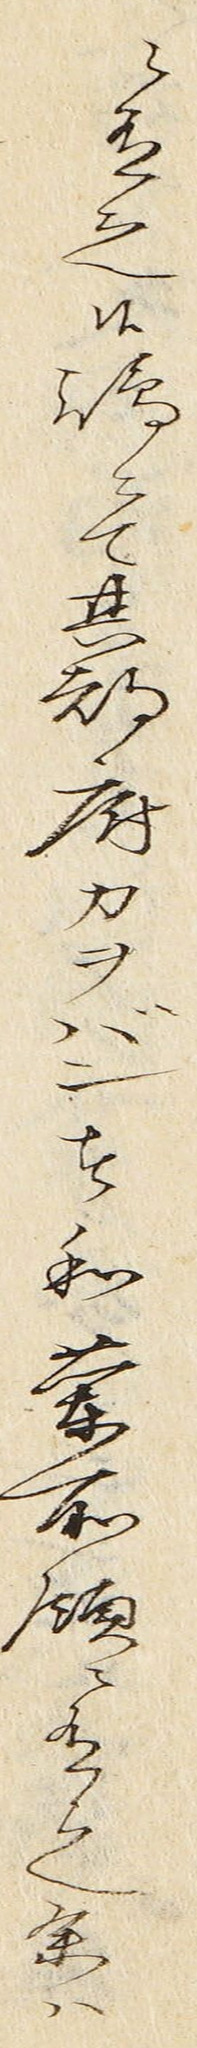に有之候嶋にて其都府カヲバンは和蘭所領に有之余は
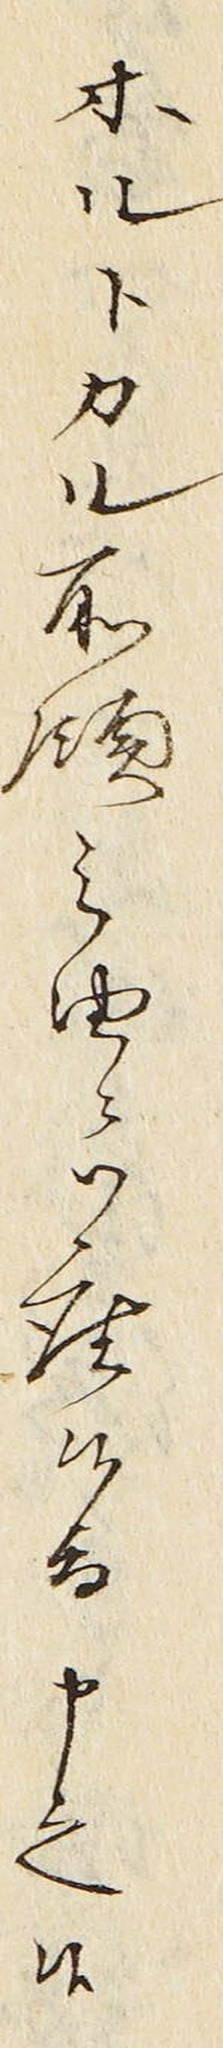ホルトカル所領之由に御座候旨申之候
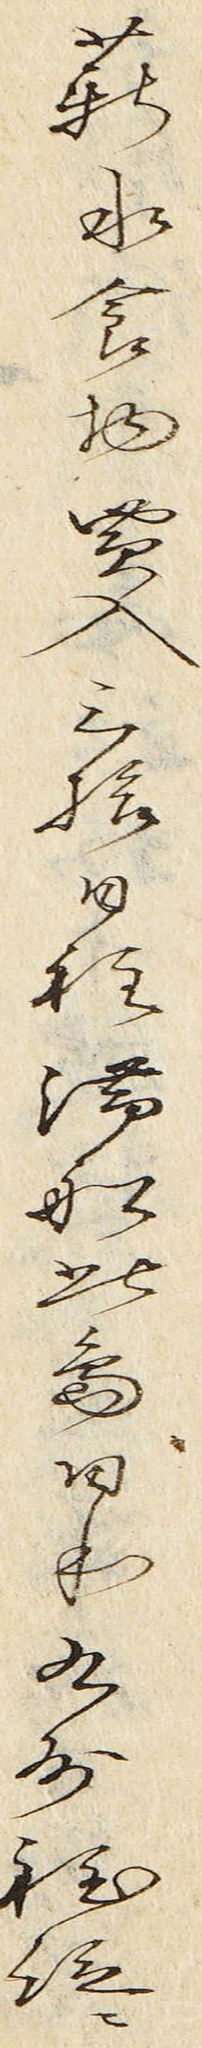薪水食物買入三拾日程滞船此島日本九州程位に
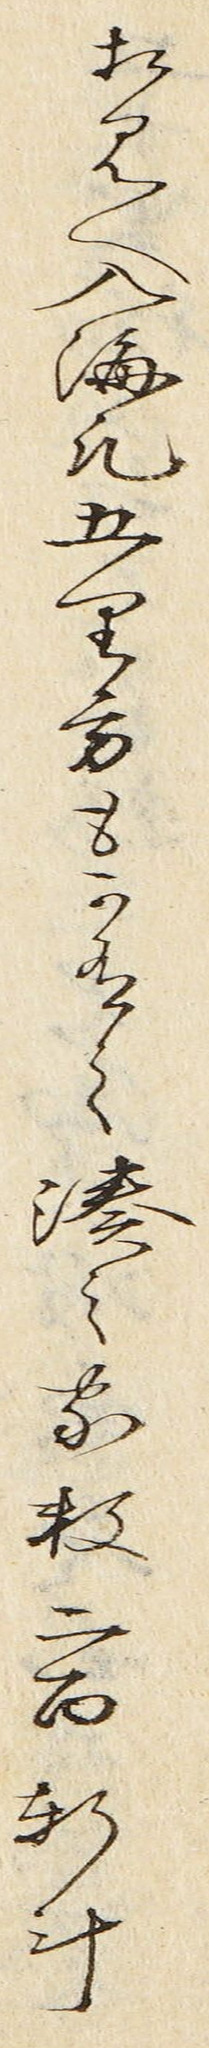相見へ入海凡五里方も可有之湊之家数二百軒計
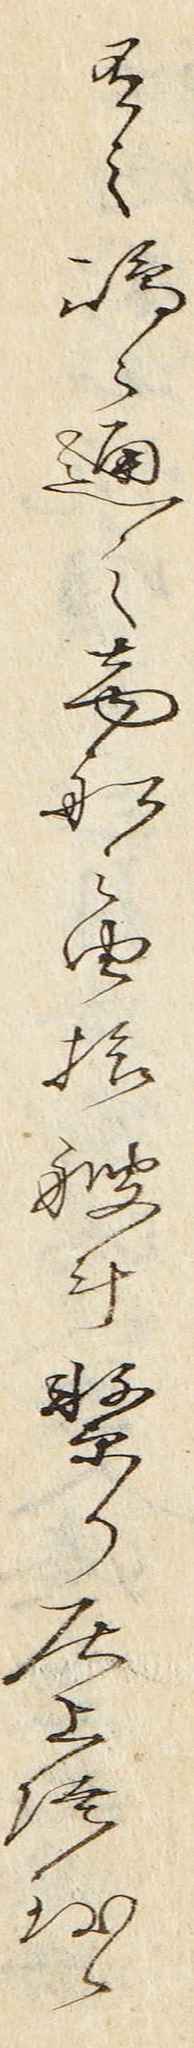有之嶋之通之商船之由拾艘計繋り居上陸致候
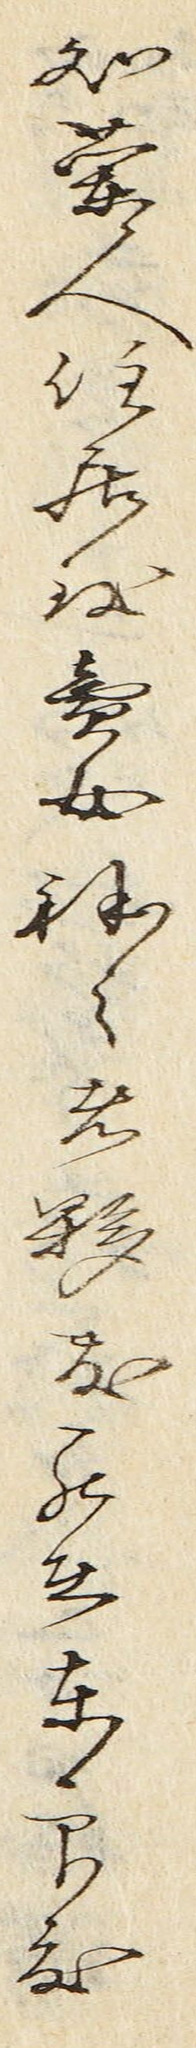処蘭人住居致売女躰之者夥敷罷在東印度
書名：土佐中浜万次郎漂流記
